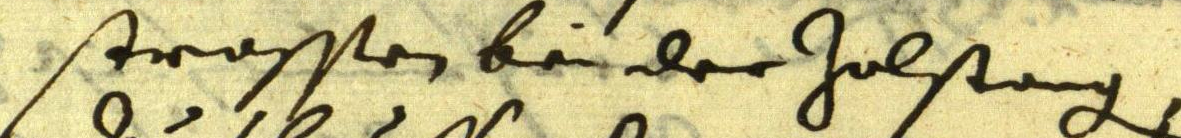strassen bei der Zolstang
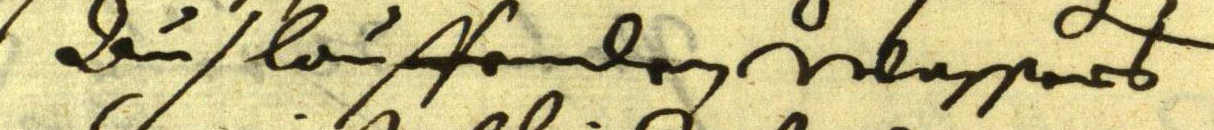Aūslaūffenden Wassers
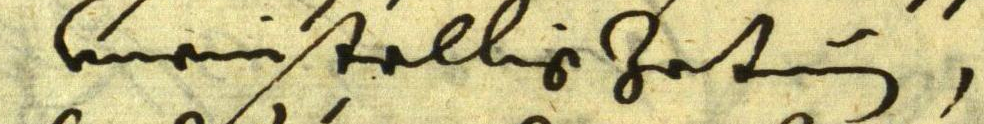vneinstellig Zetūen,
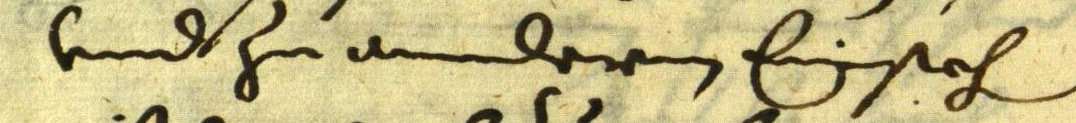vnd Zū anndern Einseh
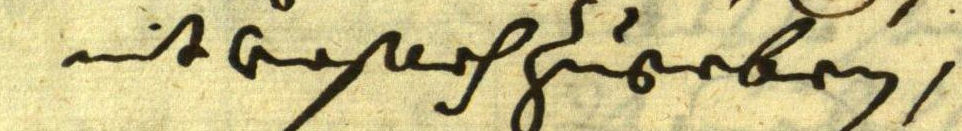nit vrsach Zūgeben,
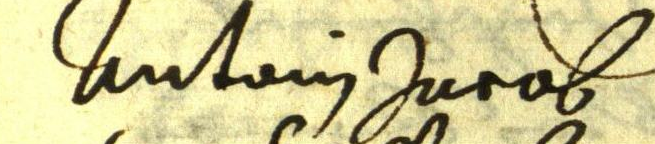Antonj Jacob
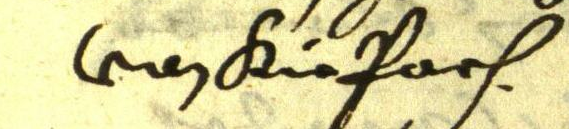von KiePach.
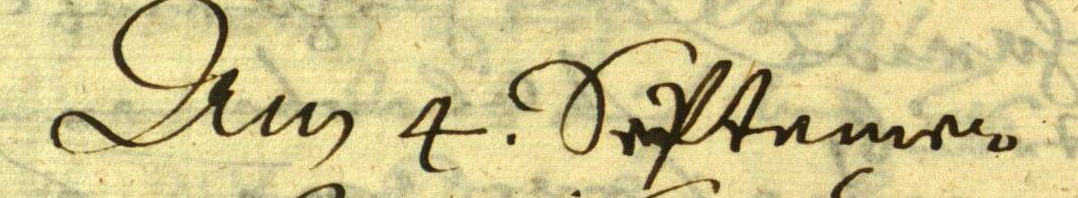Am 4. SePtemer
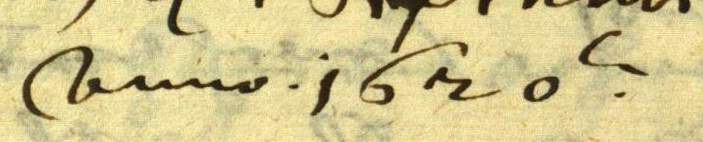Anno .1620.t
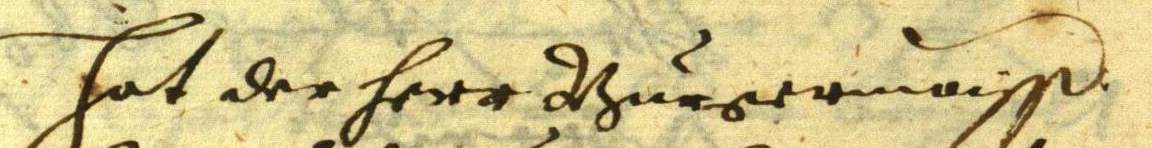Hat der herr Būrgermaisst
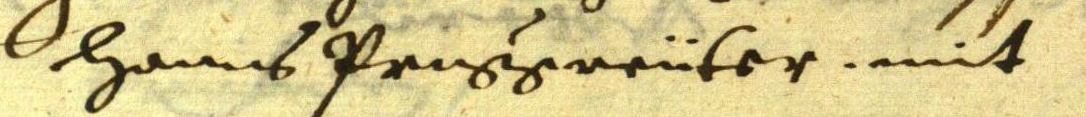Hanns Prūggreüter. mit
